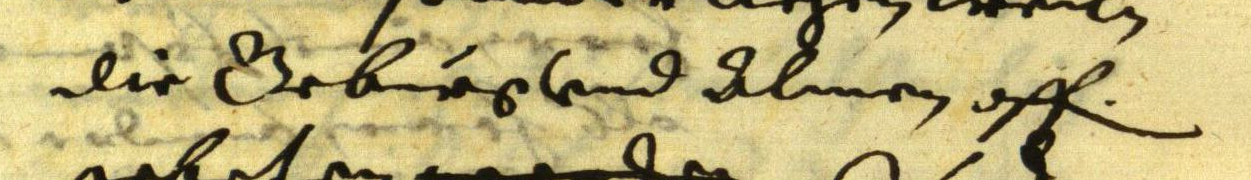die Gebūrg vnd Almen off.
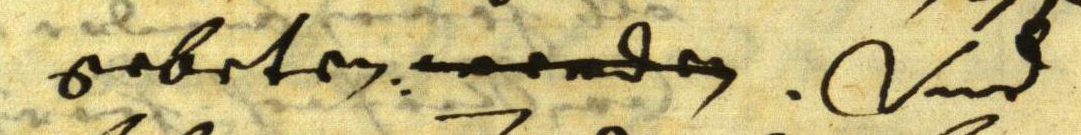gebeten: werden. Vnd
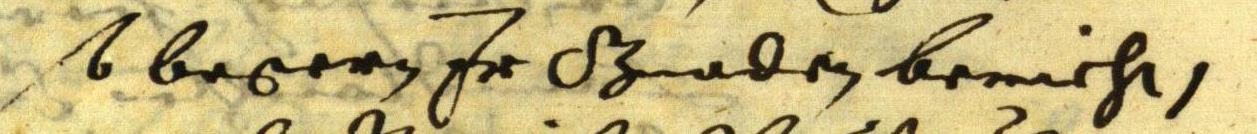so begern Ir Gnaden bericht,
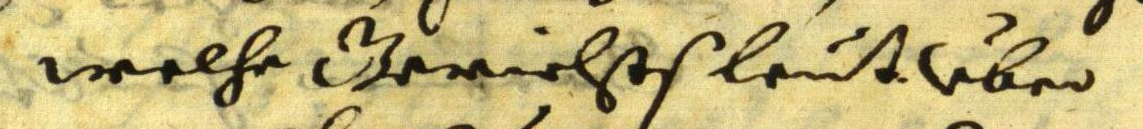welche Gerichtsleüt v̄ber
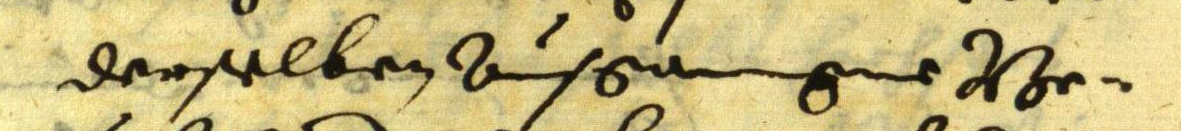derselben Aūsganngner Be¬
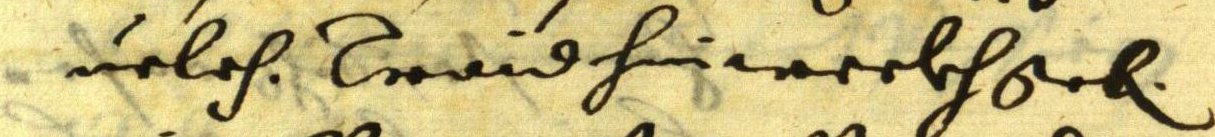ūelch. Traid hinweckh geb.
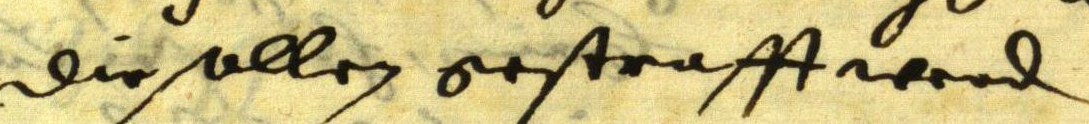die sollen gestrafft werd
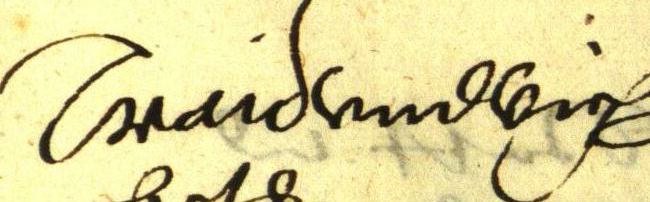Traid vnd Vieh
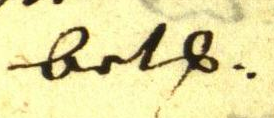bet:
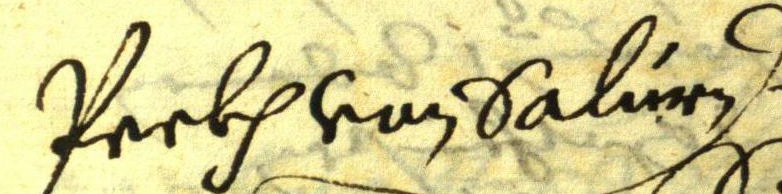Peckh von Salūrn
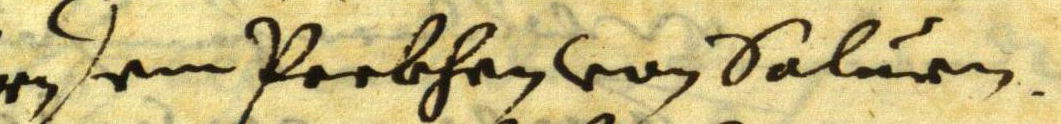Dem Peckhen von Salūrn.
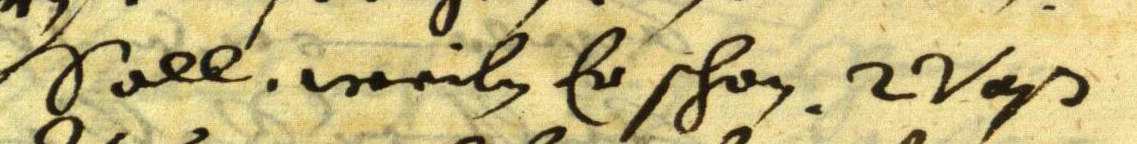Soll. weiln Er schon. 2 Vaß
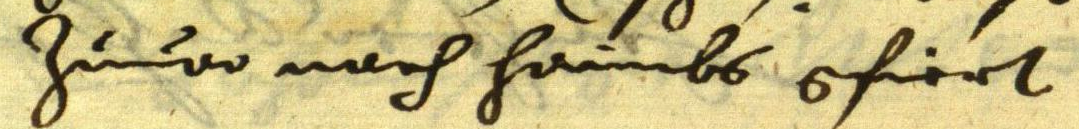Zūūor nach haimbs gfiert
